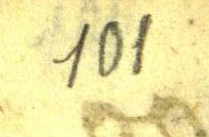101
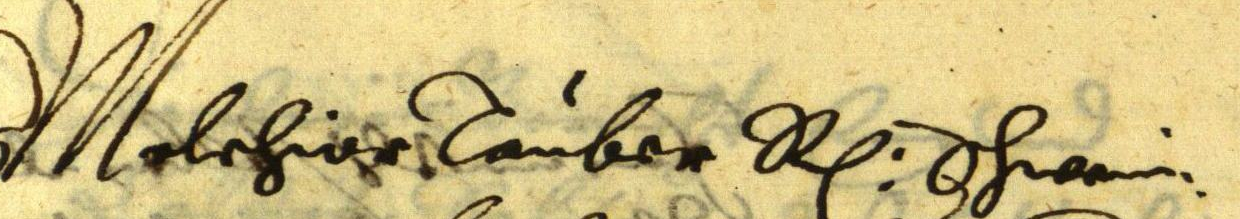Melchior Taūber R: Schwein¬
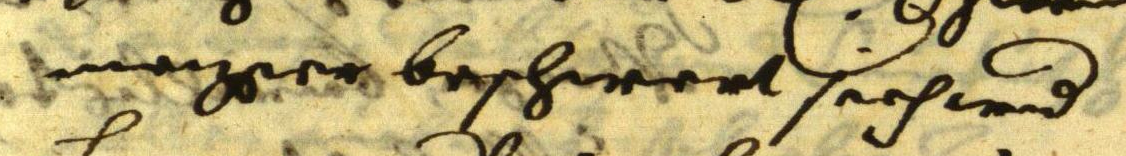mezger beschwert sich wid
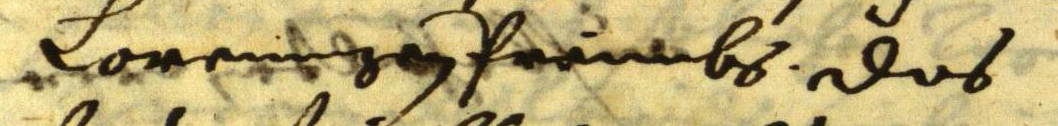Lorennzen Preimbs. das
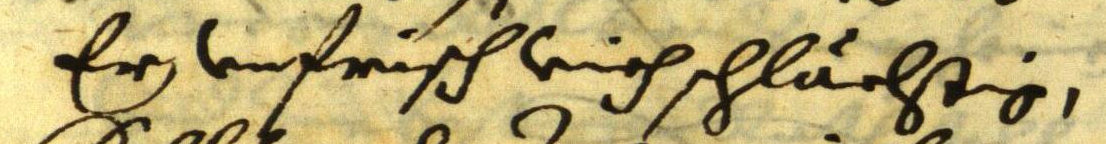Er vnfrisch vieh schlāchtig,
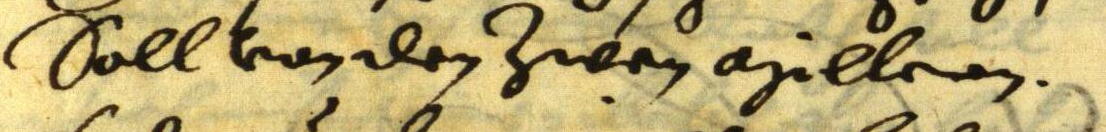Soll von den Zwen Millern.
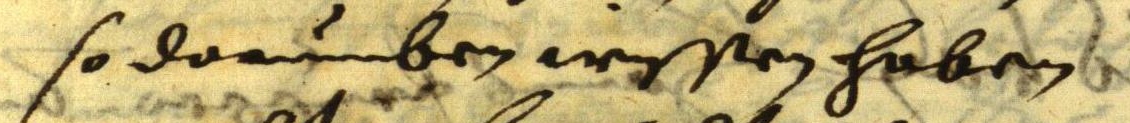so darūmben wissen haben
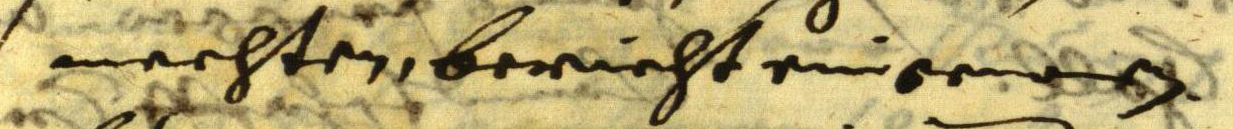mechten, bericht eingenomen.
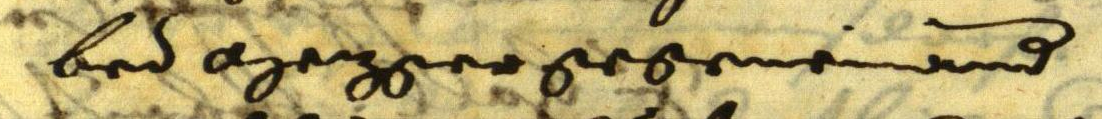bed Mezger gegeneinand
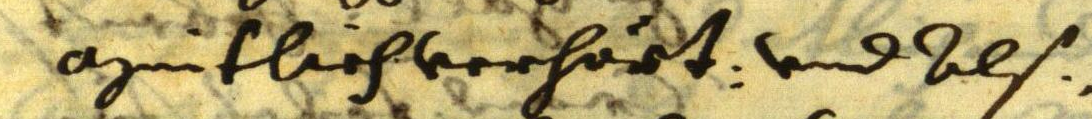Mintlich verhōrt: vnd Als¬
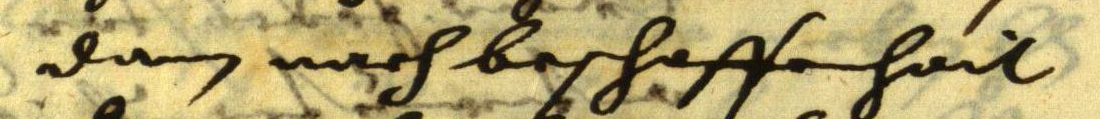dann nach beschaffenhait
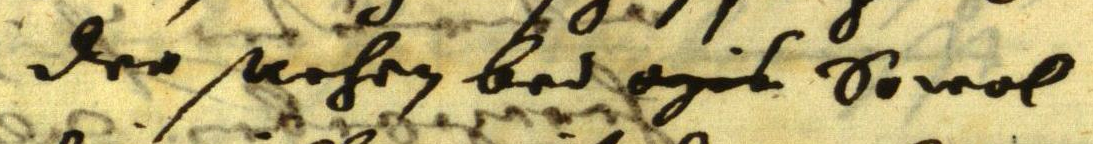der sachen bed Mis. So wol
